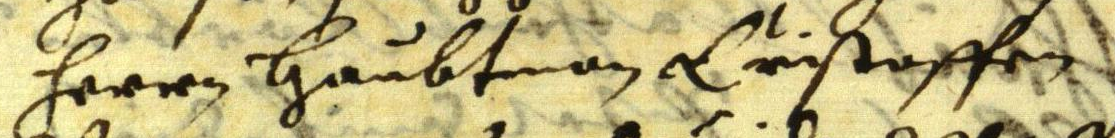herrn Haūbtman Cristoffen
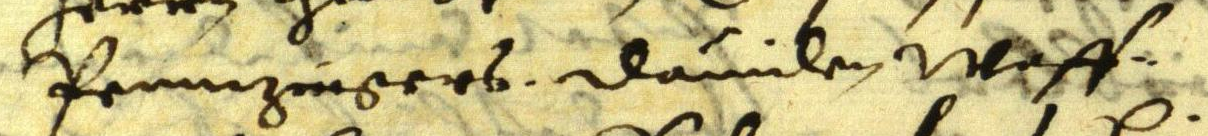Pennzingers. Daūiden Waff¬
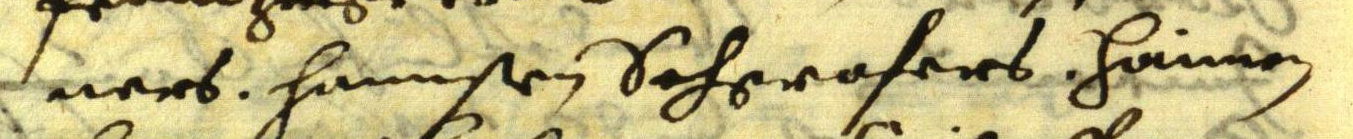ners. hannsen Schgrafers. haimen
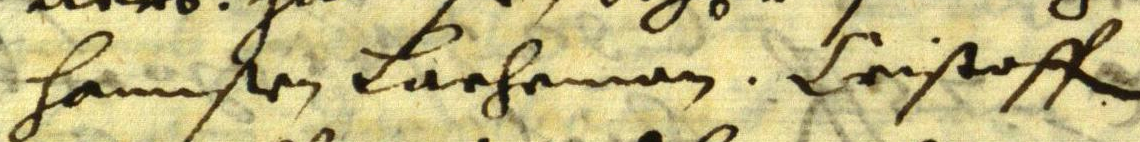hannsen Locheman. Cristoff
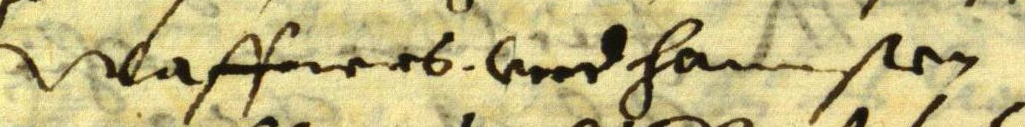Waffners. vnd hannsen
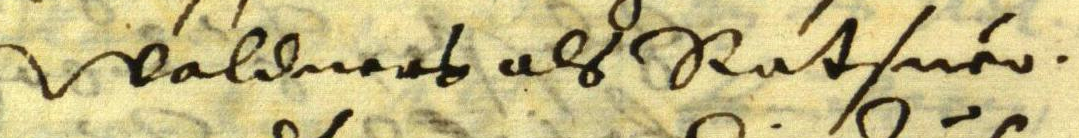Waldners als Ratsver¬
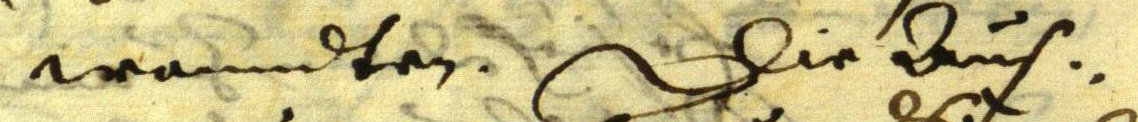wandten. Die Aūs¬
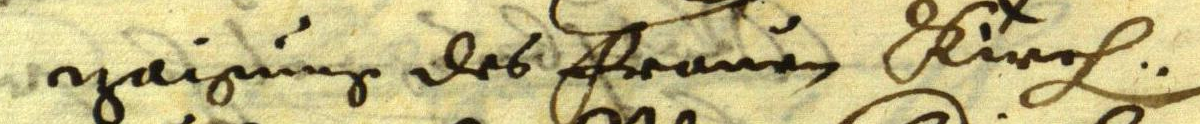zaigūng des Fraūen Kirch¬
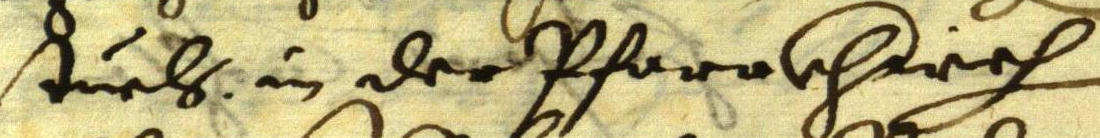stūels. in der Pfarrkhirch
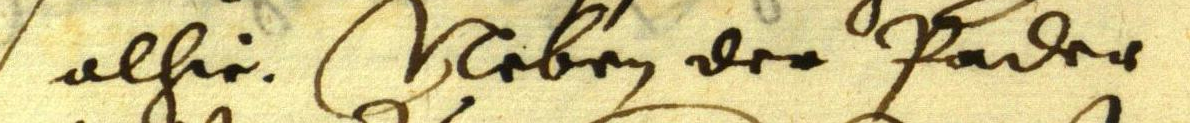alhie. Neben der Pader¬
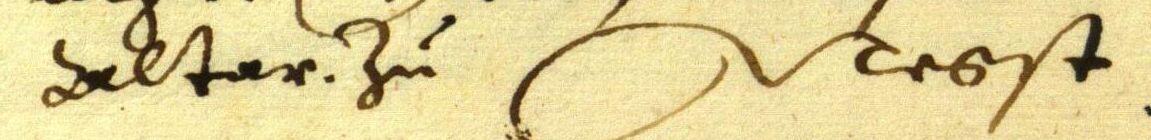Altar. Zū Negst
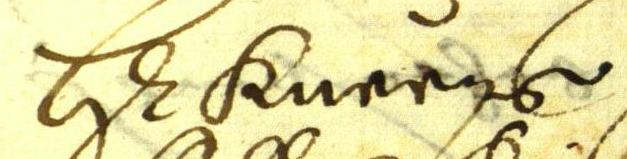H Kūeens
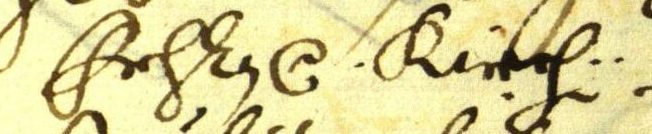Frhn etc. Kirch¬
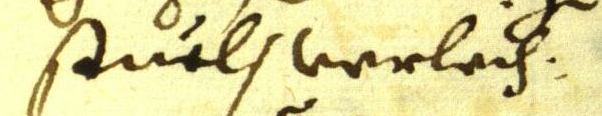stūel verleich¬
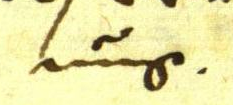ūng.
